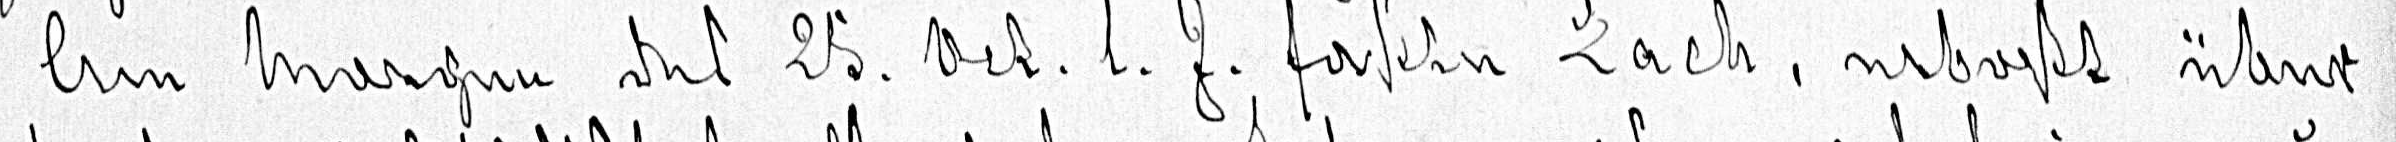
Am Morgen des 25. Oct. l. J. faßte Lach, erbost über
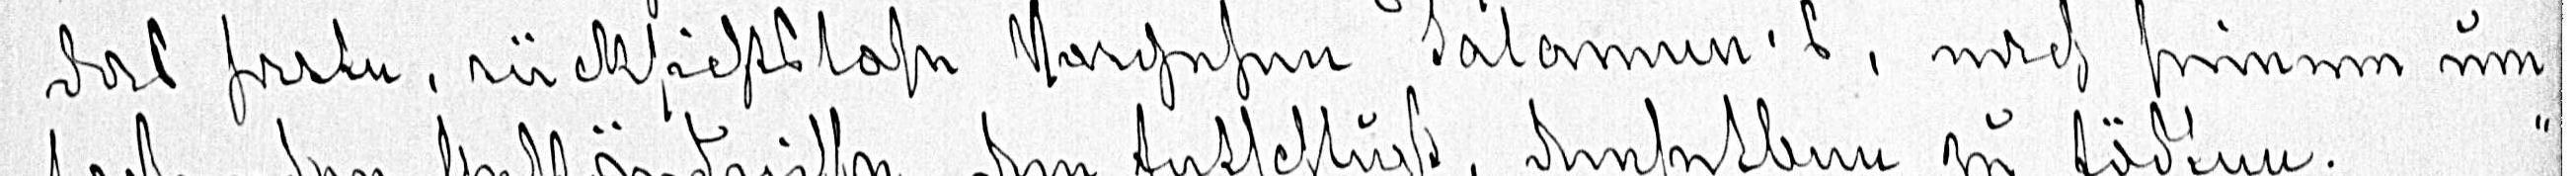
das harte, rücksichtslose Vorgehen Salamun’s, nach seinem um¬
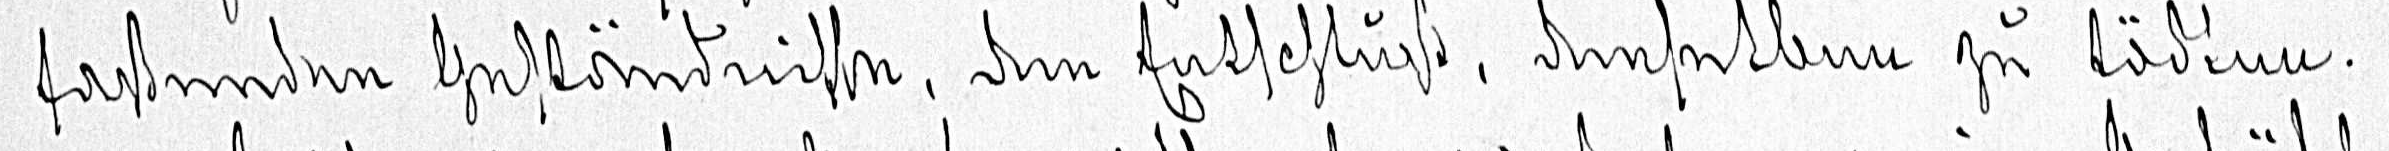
faßenden Geständnisse, den Entschluß, denselben zu tödten.
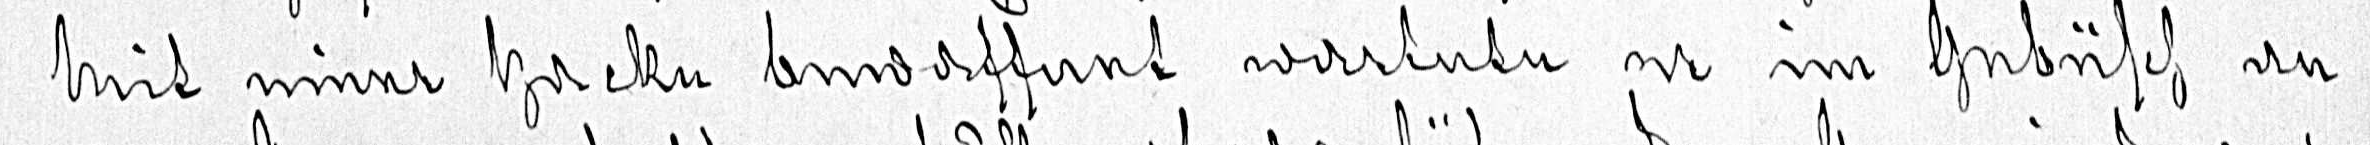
Mit einer Hack bewaffnet wartete er im Gebüsch an
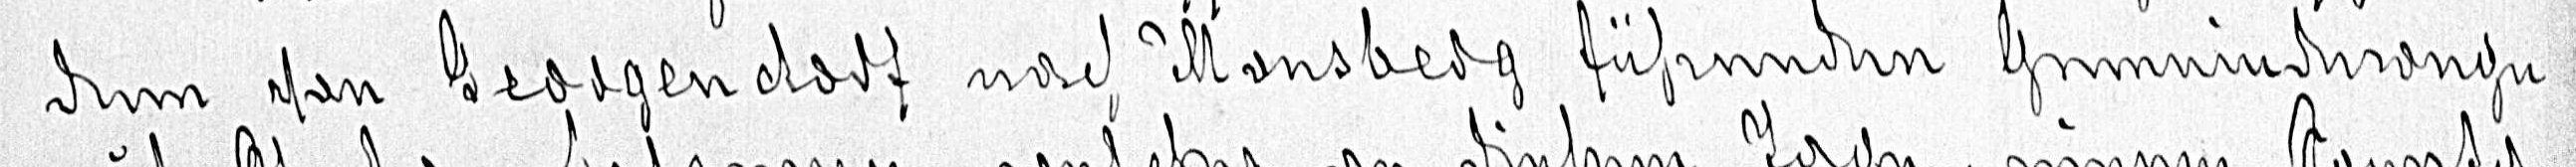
dem von Georgendorf nach Monsberg führenden Gemeindewege
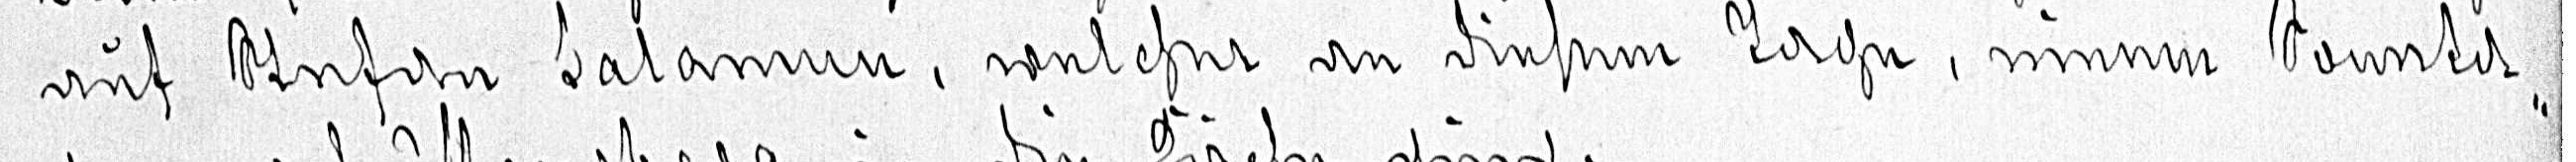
auf Stefan Salamun, welcher an diesem Tage, einem Sonnta¬
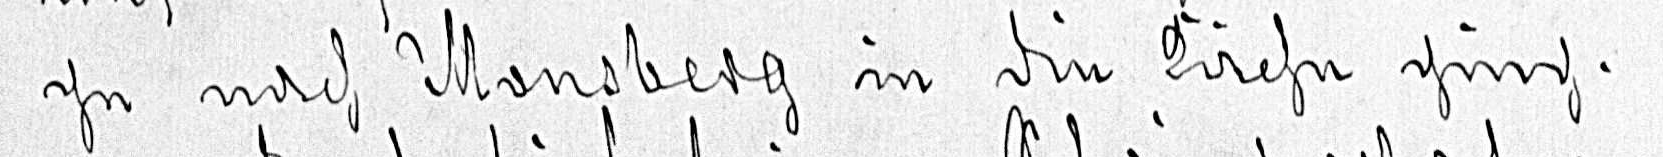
ge nach Monsberg in die Kirche ging.
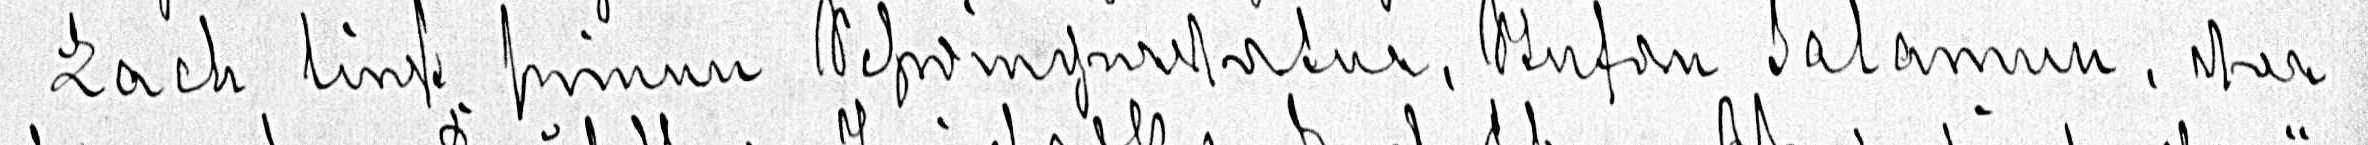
Lach ließ seinen Schwiegervater, Stefan Salamun, vor
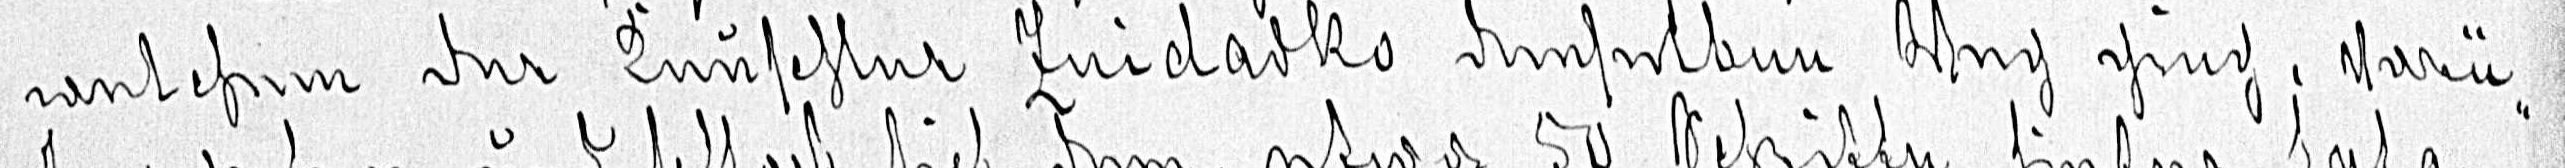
welchem der Keuschler Znidarko denselben Weg ging, vorü¬
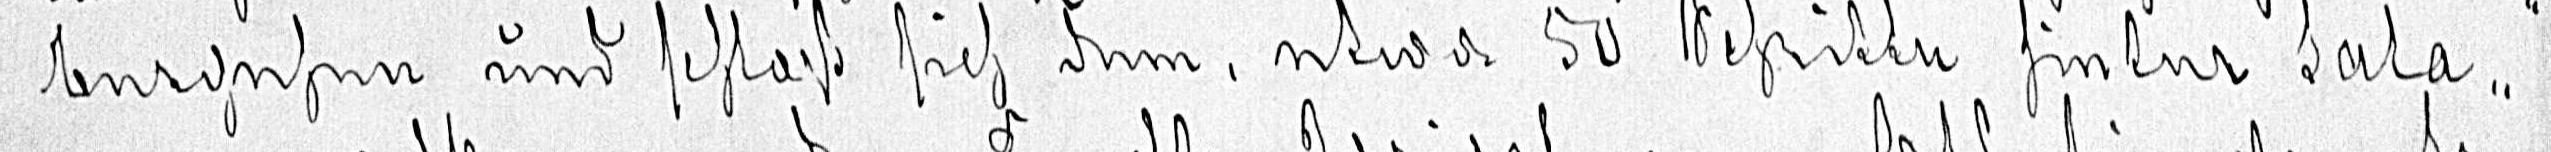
bergehen und schloß sich dem, etwa 50 Schritte hinter Sala¬
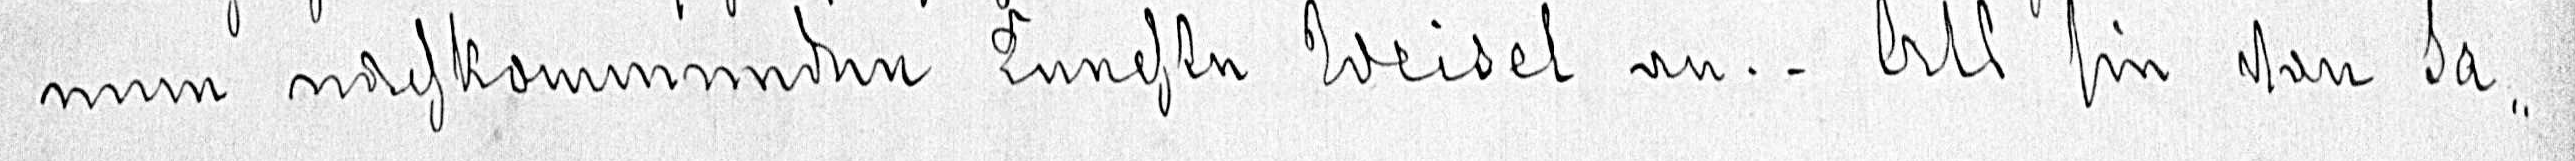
mun nachkommenden Knechte Weisel an. Als sie von Sa¬
